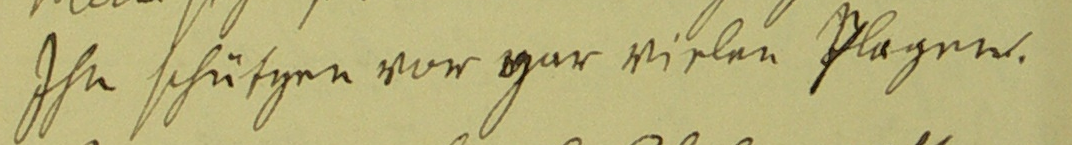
Ihn schützen vor gar vielen Plagen.
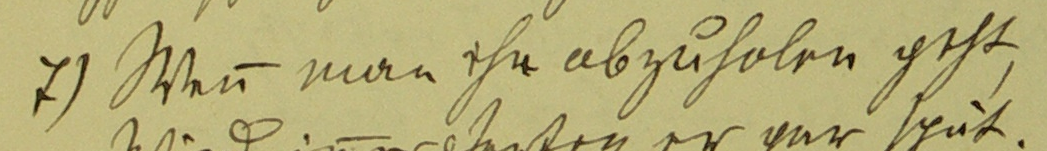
7) Wen man ihn abzuholen geht,
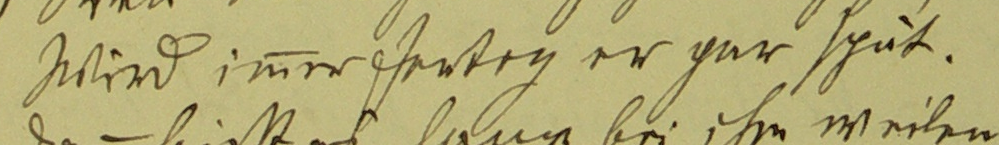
wird immer fertig er gar spät.
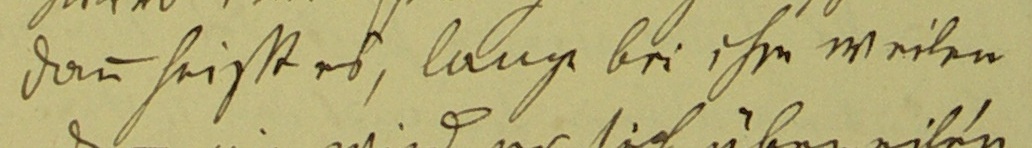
Dan heißt es lange bei ihm weilen
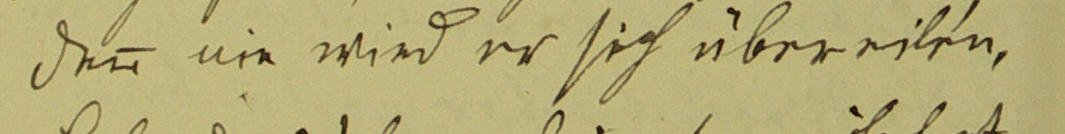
Den nie wird er sich übereilen.
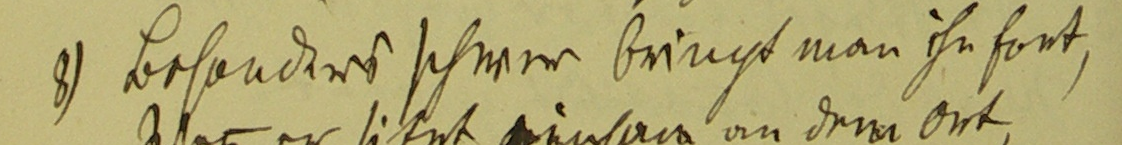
8) Besonders schwer bringt man ihn fort,
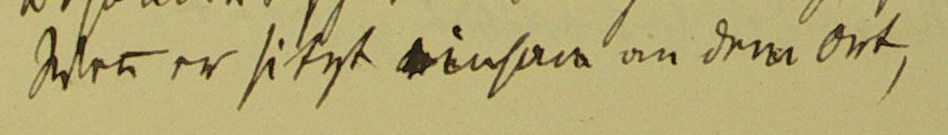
Wen er sitzt einfach an dem Ort,
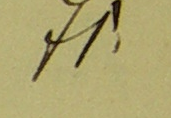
71
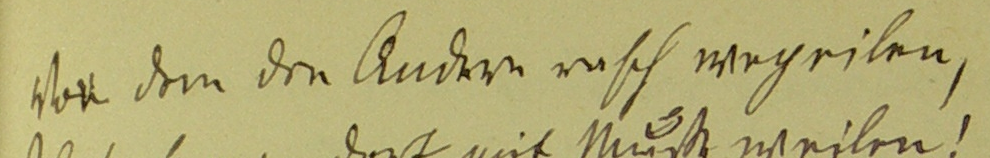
Von dem die Anderen rasch wegeilen,
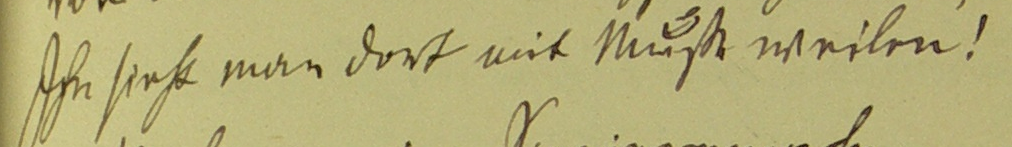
Ihn sieht man dort mit Muße weilen !.
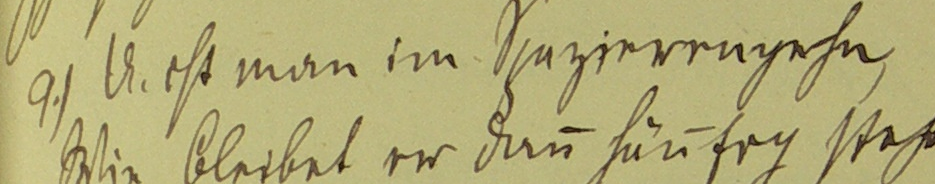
9) U. ist man im Spazierengehen,
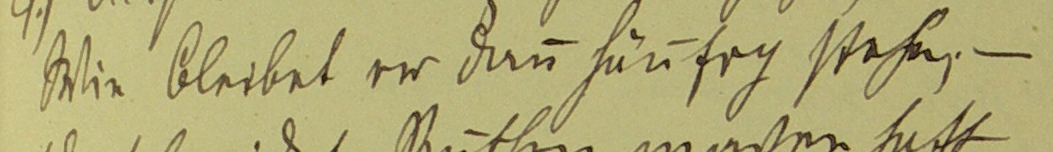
Wie bleibet er dan häufig stehen. -
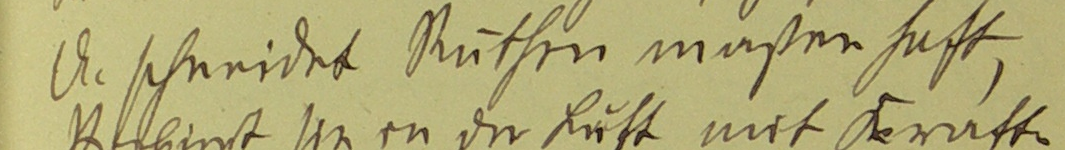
U. schneidet Ruthen maßenhaft,
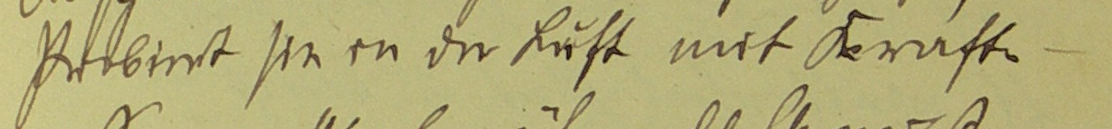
Probiert sie in der Luft mit Kraft.
